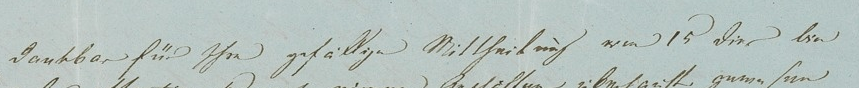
Dankbar für Ihre gefällige Mittheilung vom 15 dies bin
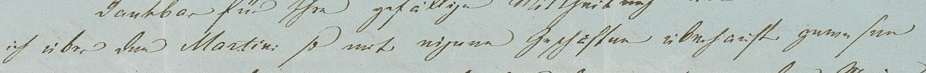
ich über den Martini so mit eignen Geschäften überhäuft gewesen
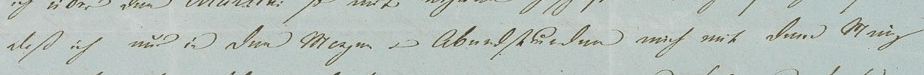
daß ich nur in den Morgen & Abendstunden mich mit dem Münz-
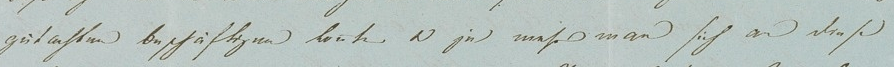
gutachten beschäftigen konnte & je mehr man sich an diese
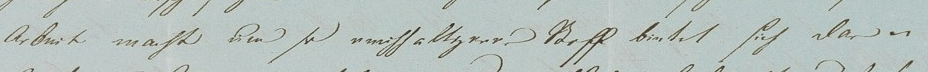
Arbeit macht um so reichhaltigrer Stoff bietet sich dar. –
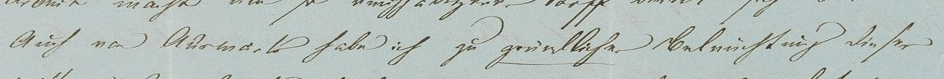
Auch von Auswärts habe ich zu gründlicher Beleuchtung dieses
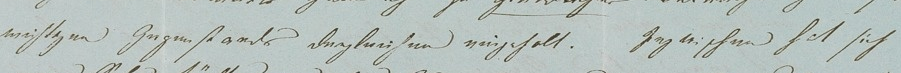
wichtigen Gegenstands dergleichen eingeholt. Inzwischen hat sich
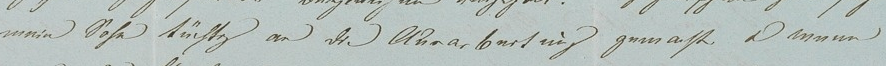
mein Sohn tüchtig an die Ausarbeitung gemacht & wenn
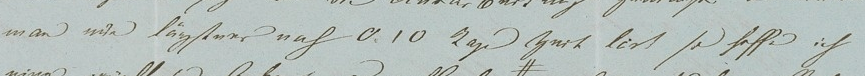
man mir längstens noch ca 10 Tage Zeit läst so hoffe ich
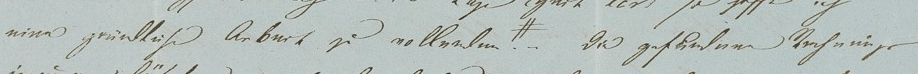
keine lange Zögerung erleide. – Die gefundnen Rechnungs-
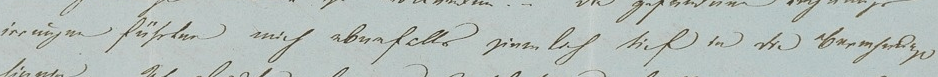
irrungen führten mich ebenfalls ziemlich tief in die Berechnungen
